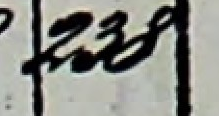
238
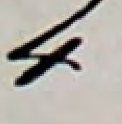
4
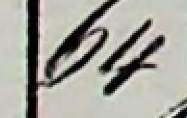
64
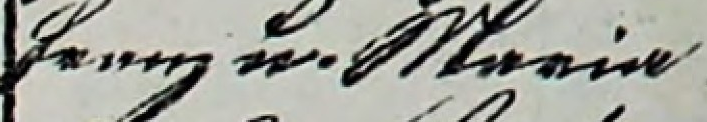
Franz u. Maria
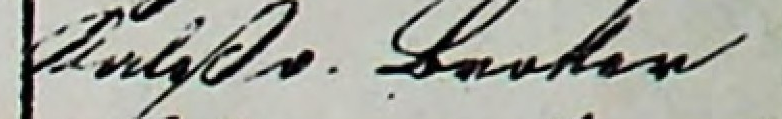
Kalß v. Broker
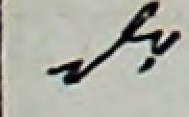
do
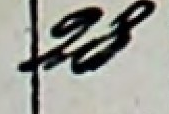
28
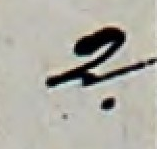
2
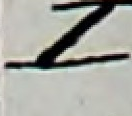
I
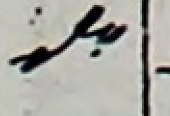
do
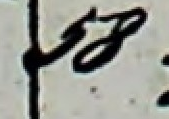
58
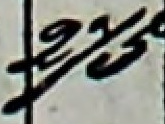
275
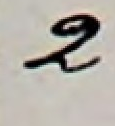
2
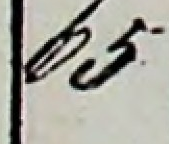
65
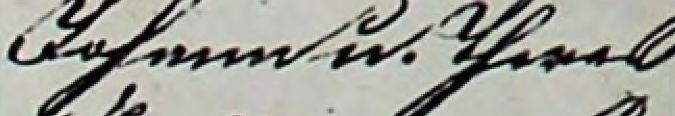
Johann u. Theres
